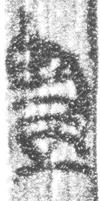監（鑒）
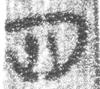四
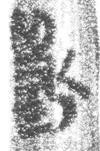○（匕）
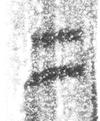二
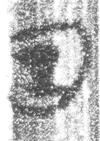○（圓）
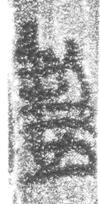監（鑒）
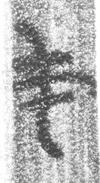屯
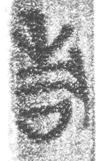青
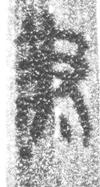黃
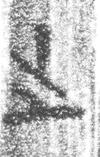之
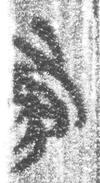○（畫）
